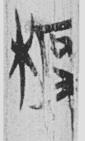槈
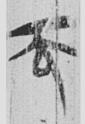而
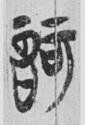訶（歌）
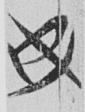𡚦（焉）
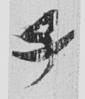子
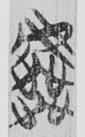虡（據）
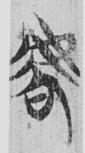○（乎）
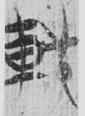○（軾）
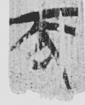而
